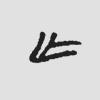亡
